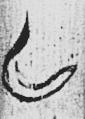㠯（以）
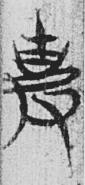尅
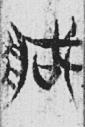戕（莊）
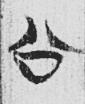公
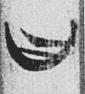曰
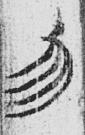勿
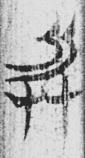兵
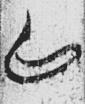㠯（以）
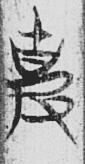尅
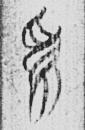奚
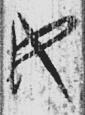女（如）
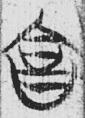合
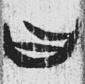曰
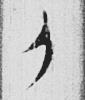人
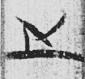之
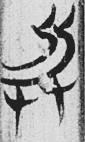兵
